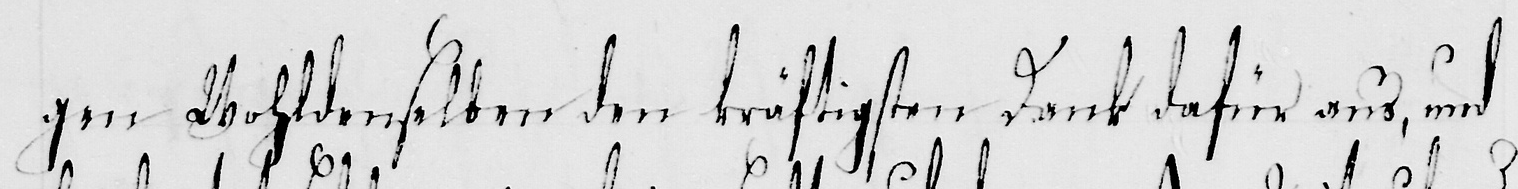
gen Wohldenselben den kräftigen Dank dafür aus, und
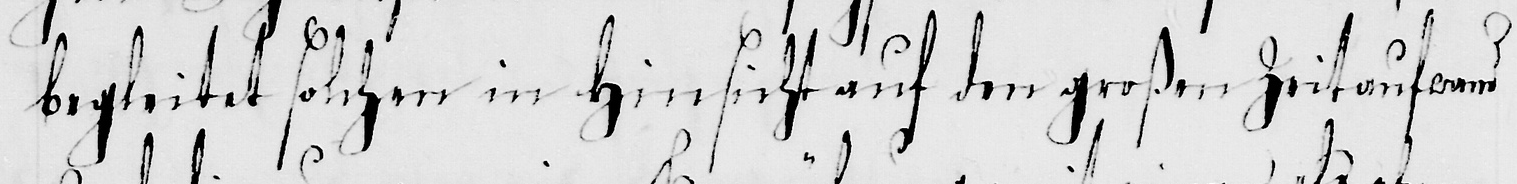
begleitet solchen in Hinsicht auf den großen Zeitaufwand
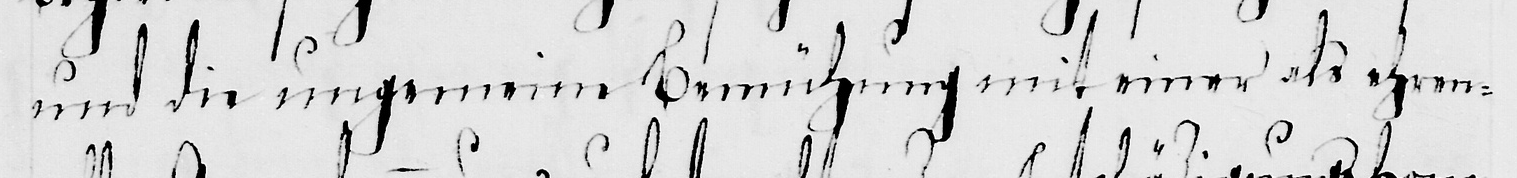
und die ungemeine Bemühung mit einer als ehren¬
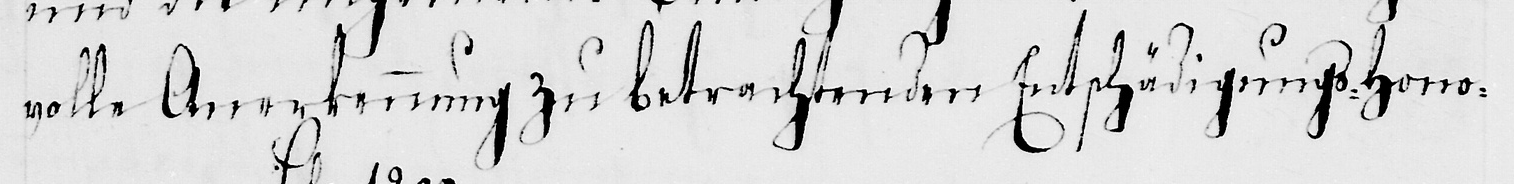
volle Anerkennung zu betrachtenden Entschädigungs-Hono¬
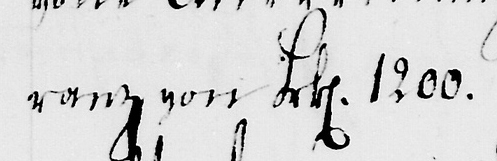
ranz von Frk[en]. 1200.
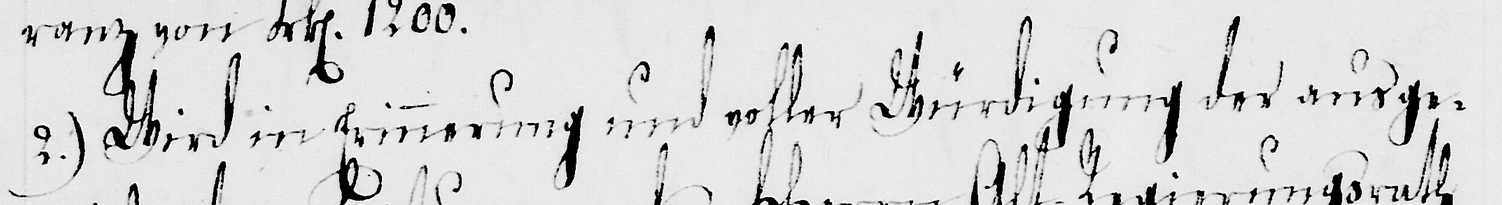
2.) Wird in Erinnerung und voller Würdigung der ausge¬
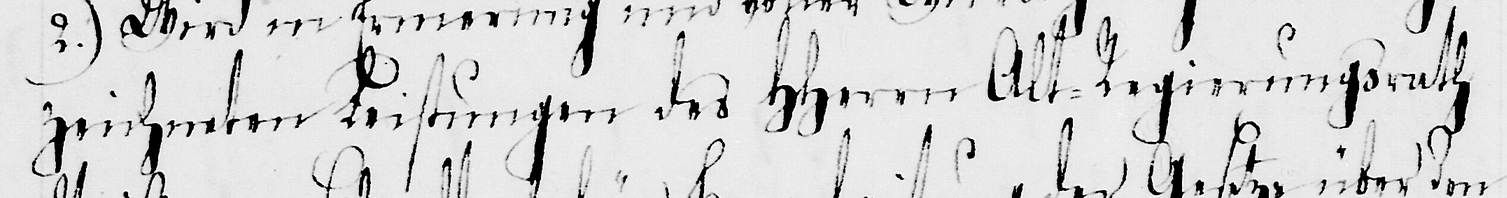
zeichneten Leistungen des HHerrn Alt-Regierungsrath
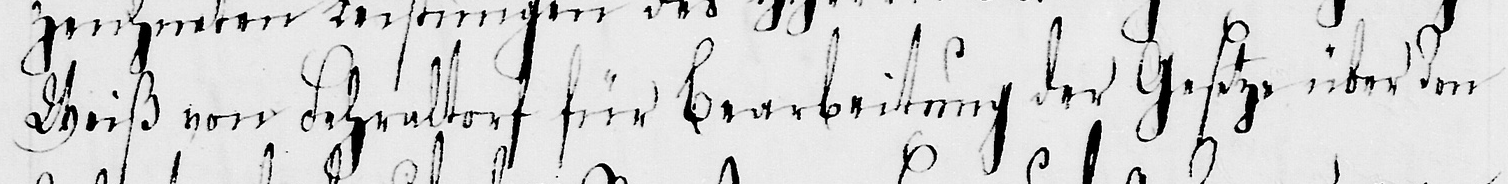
Weiß von Fehraltorf für Bearbeitung der Gesetze über den
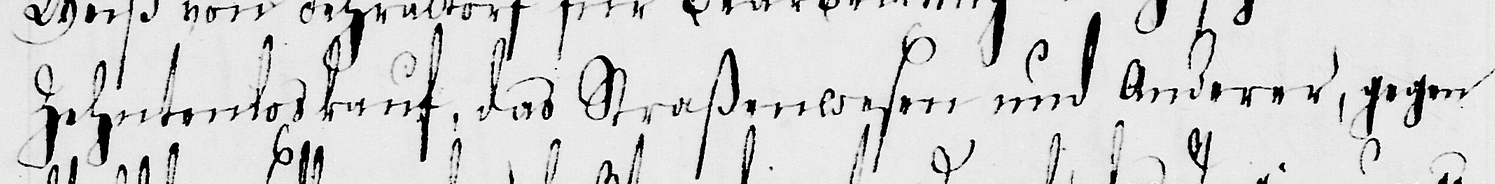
Zehntenloskauf, das Straßenwesen und Anderer, gegen
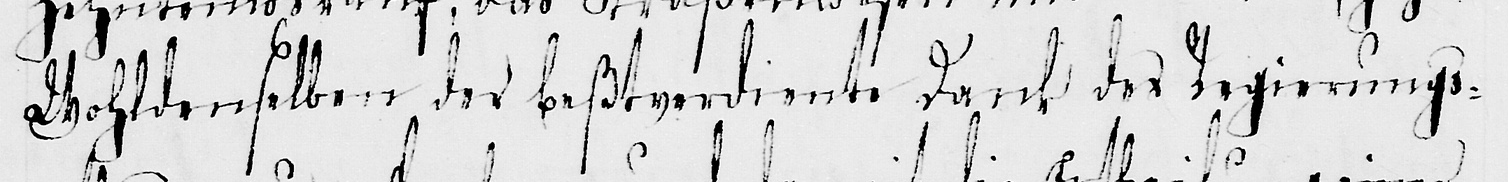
Wohldenselben der beßtverdiente Dank des Regierungs¬
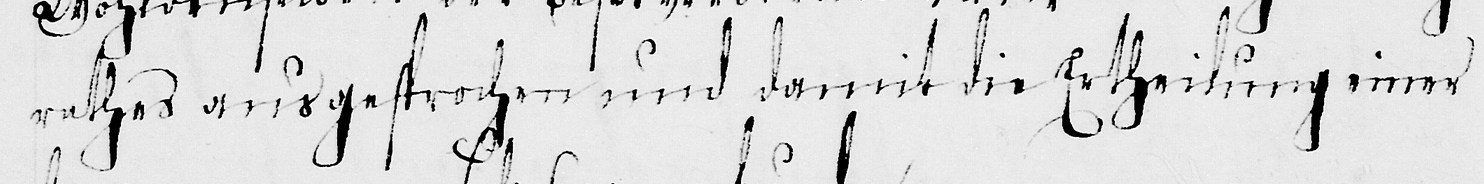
rathes ausgesprochen und damit die Ertheilung einer
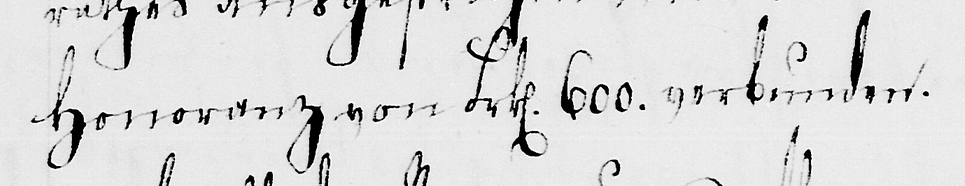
Honoranz von Frk[en]. 600. verbunden.
